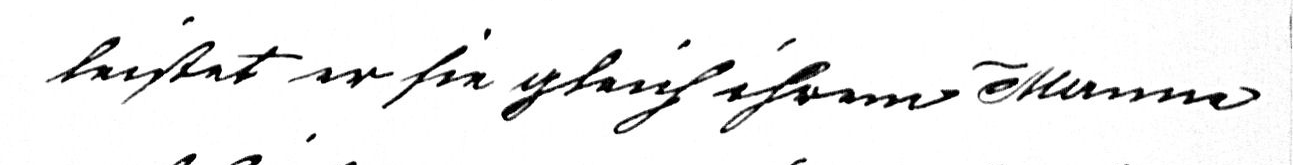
leistet er sie gleich ihrem Manne
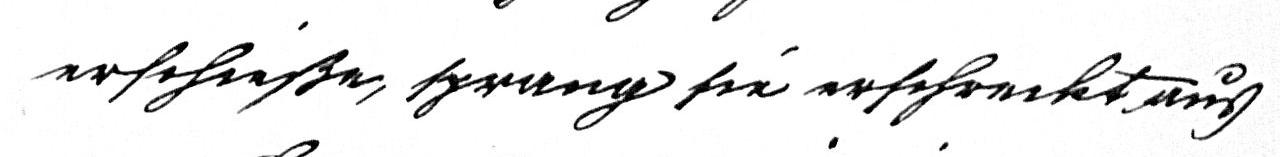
erschieße, sprang sie erschreckt aus
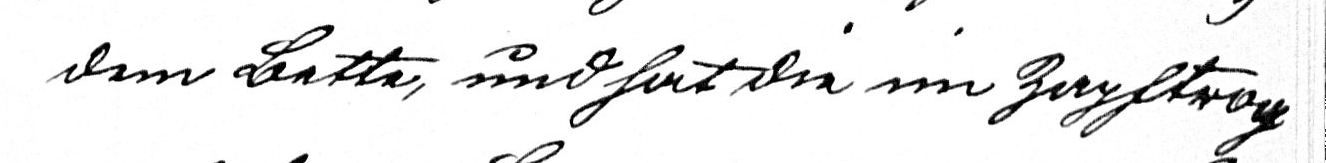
dem Bette, und hat die im Zapftrog
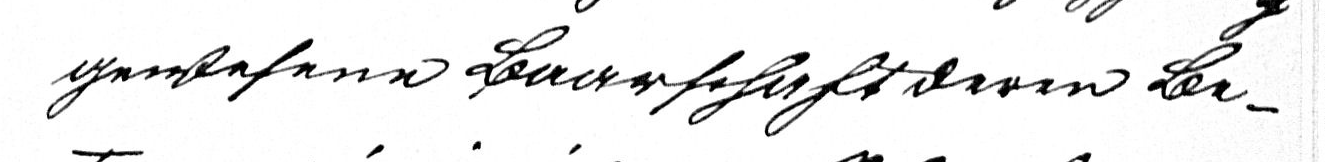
gewesene Baarschaft deren Be¬
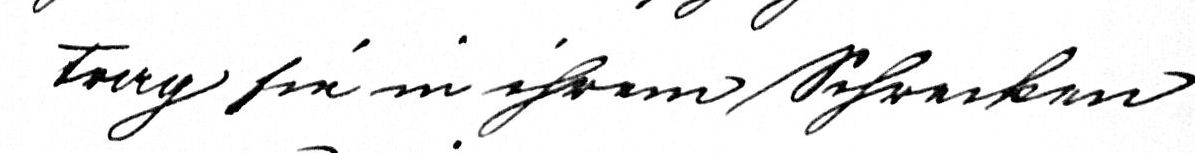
trag sie in ihrem Schrecken
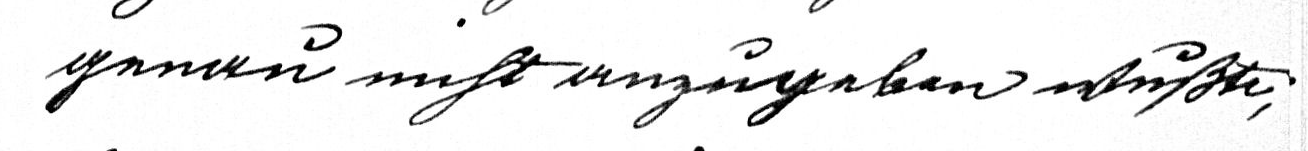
genau nicht anzugeben wußte;
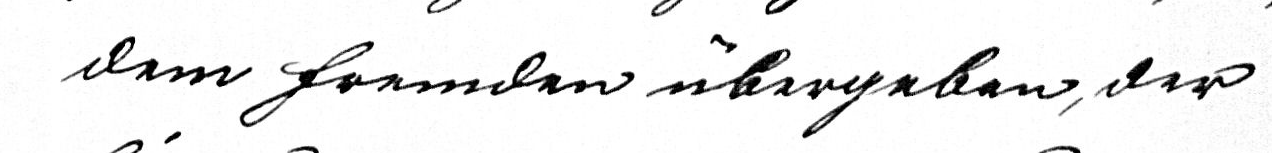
dem fremden übergeben, der
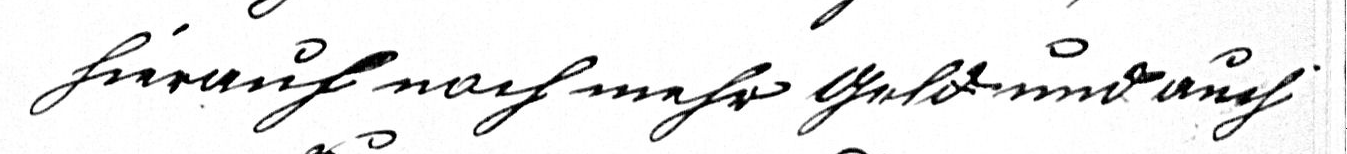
hierauf noch mehr Geld und auch
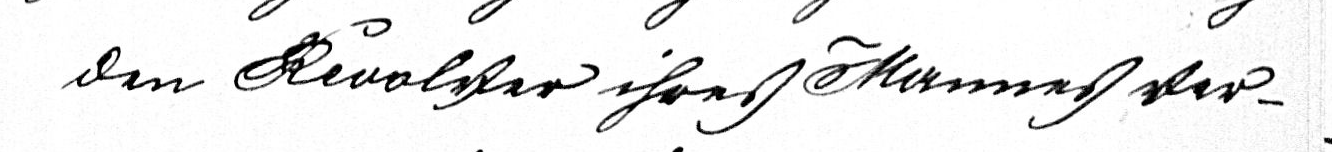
den Revolver ihres Mannes ver¬
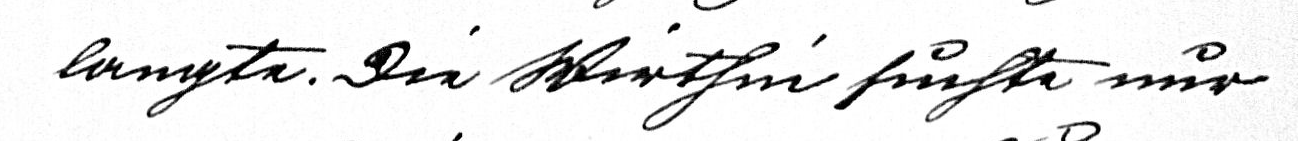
langte. Die Wirthin suchte nur
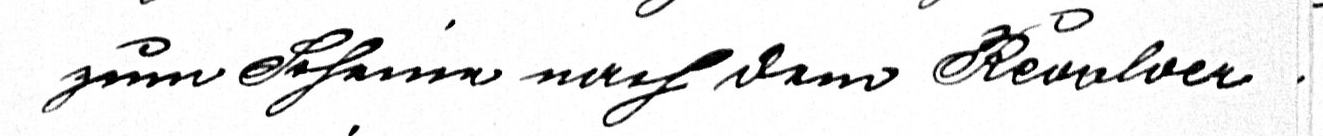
zum Scheine nach dem Revolver
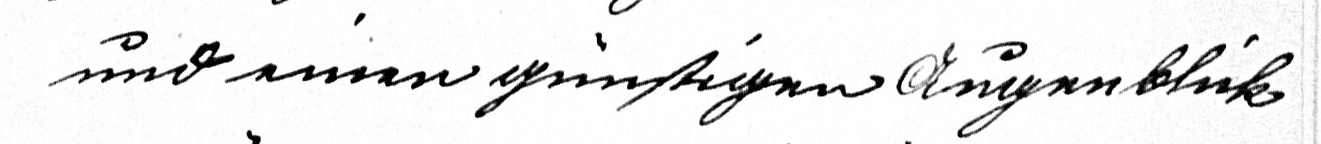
und einen günstigen Augenblick
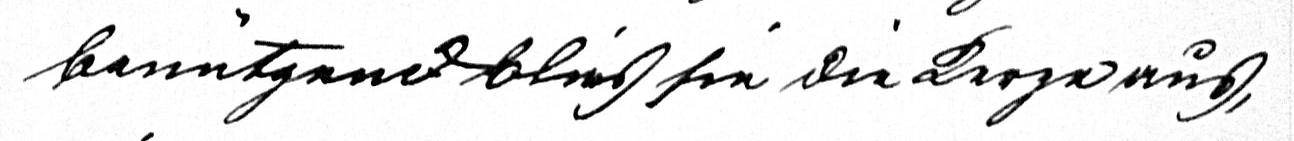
benützend bleis sie die Kerze aus,
